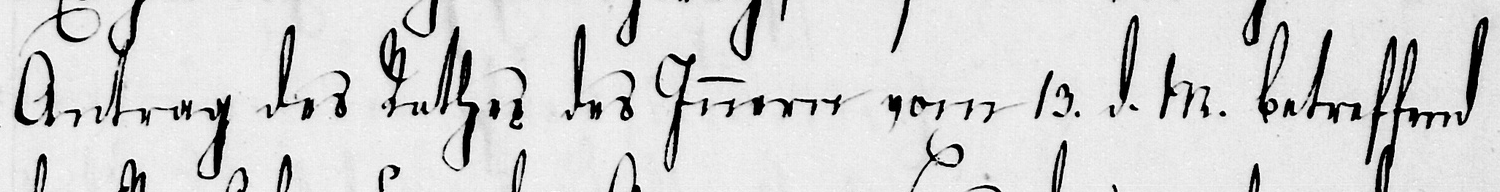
Antrag des Rathes des Innern vom 13. d. M. betreffend
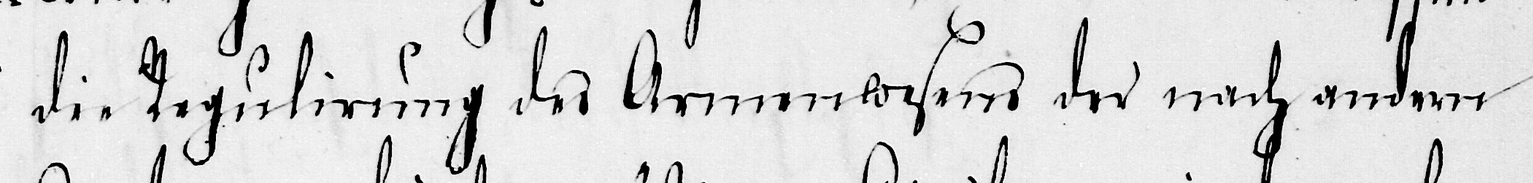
die Regulirung des Armenwesens der nach andern
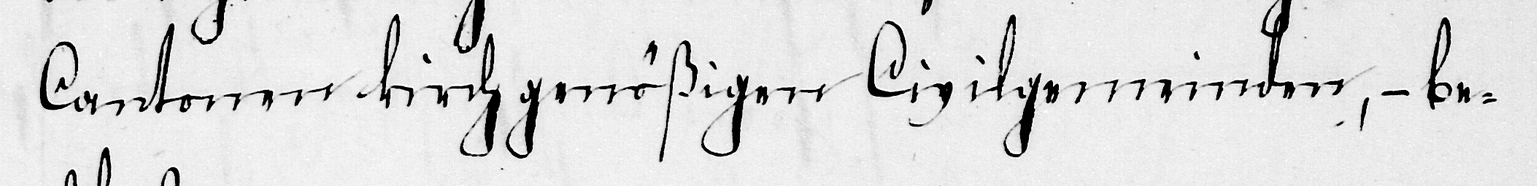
Cantonen kirchgenößigen Civilgemeinden, – bes¬
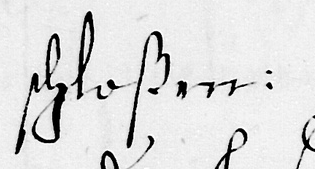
chloßen:
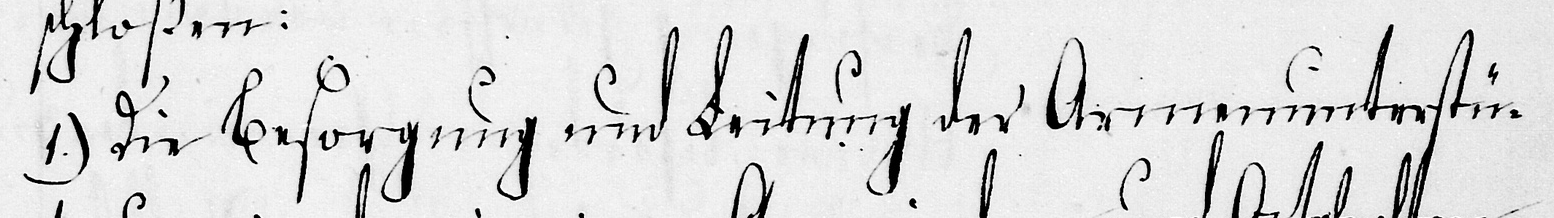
1.) Die Besorgung und Leitung der Armenunterstü¬
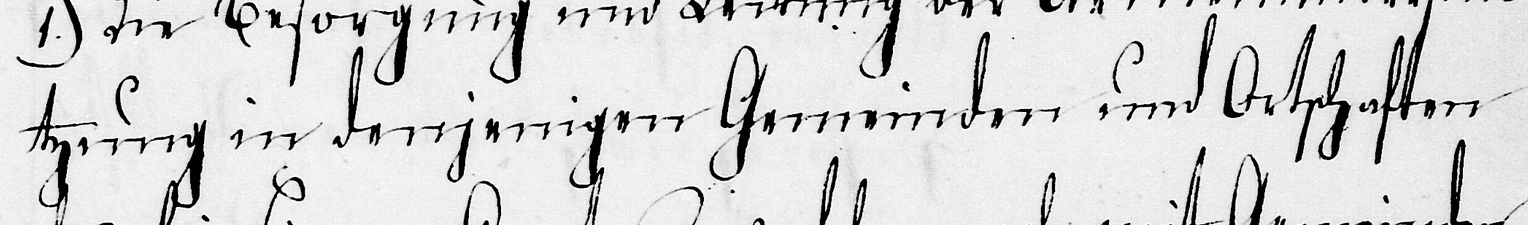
tzung in denjenigen Gemeinden und Ortschaften
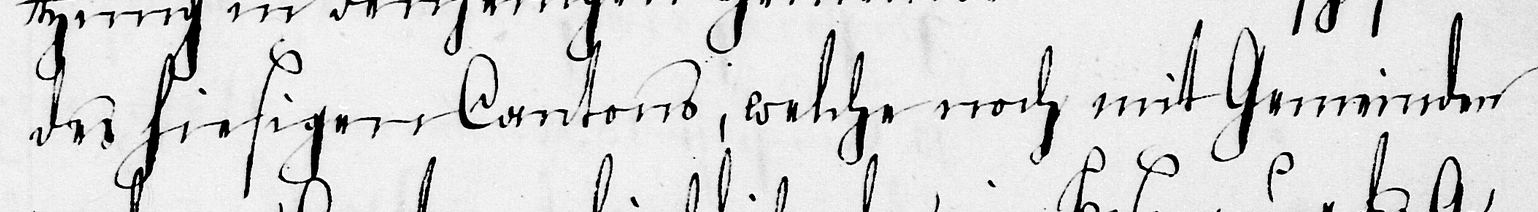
des hiesigen Cantons, welche noch mit Gemeinden
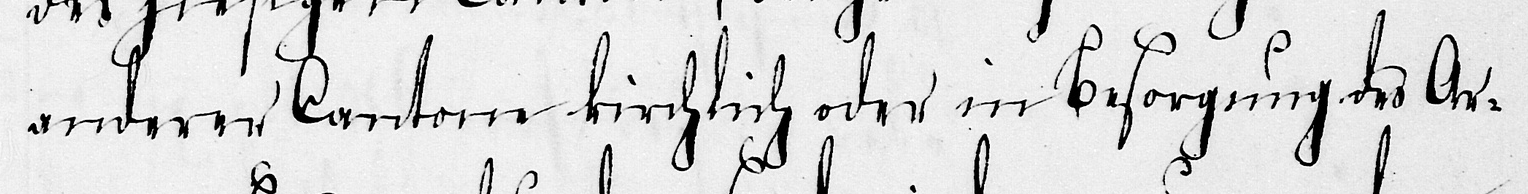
anderer Cantone kirchlich oder in Besorgung des Ar¬
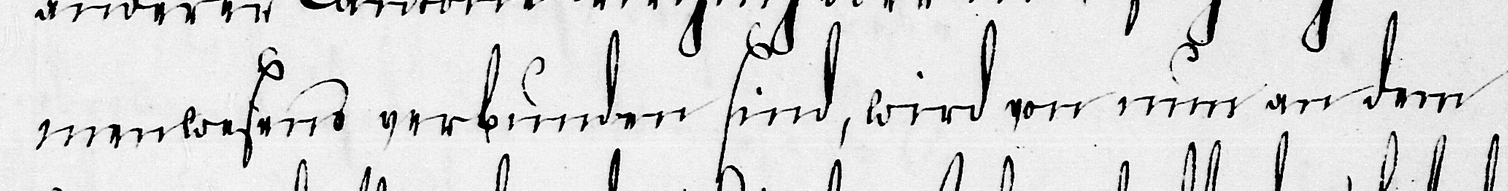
menwesens verbunden sind, wird von nun an dem
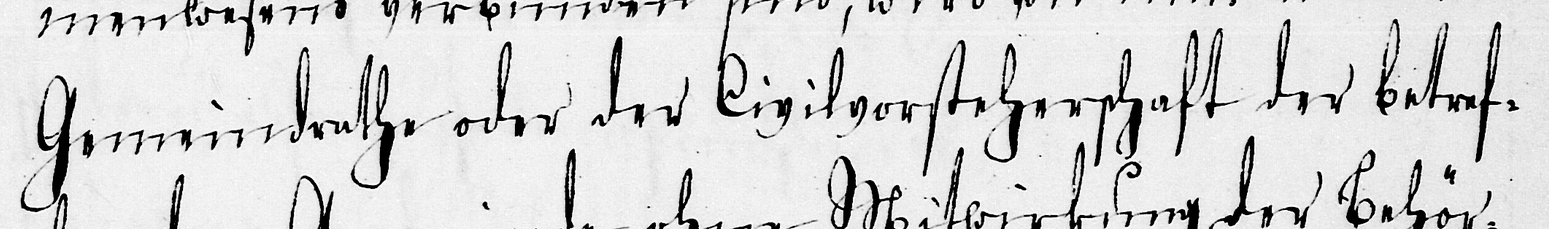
Gemeindrathe oder der Civilvorsteherschaft der betref¬
